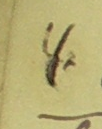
4
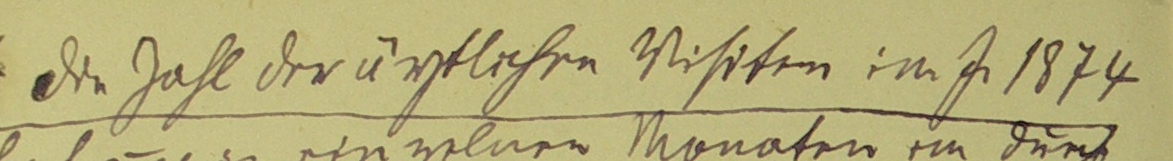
Die Zahl der ärztlichen Visiten im J. 1874
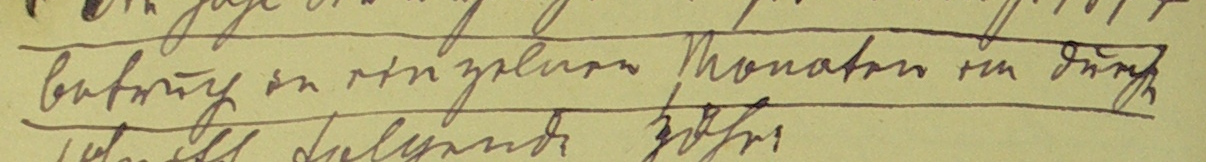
betrug in einzelnen Monaten im Durch-
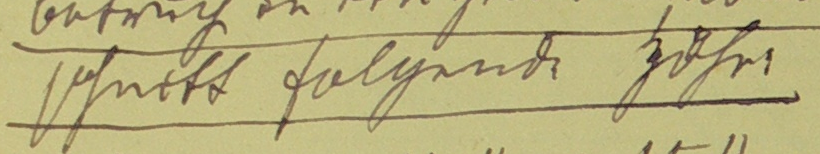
schnitt folgende Höhe:
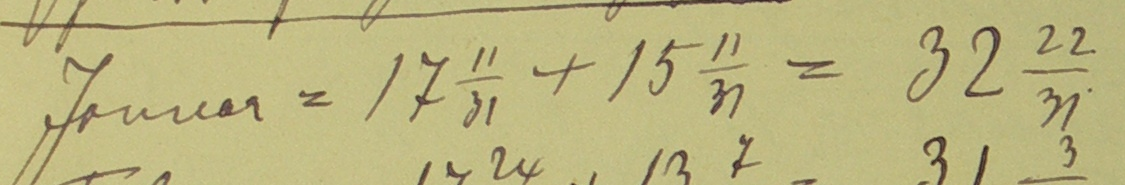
Januar = 17 11/31 + 15 11/31 = 32 22/31
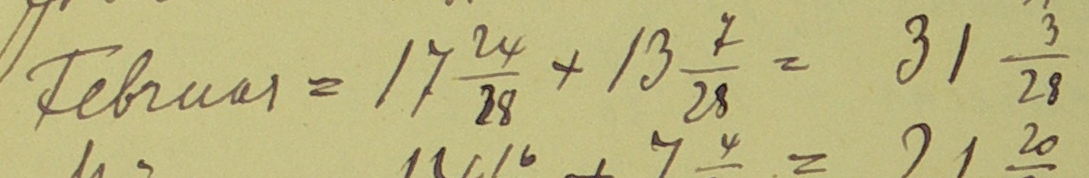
Februar = 17 24/28 + 13 7/28 = 31 3/31
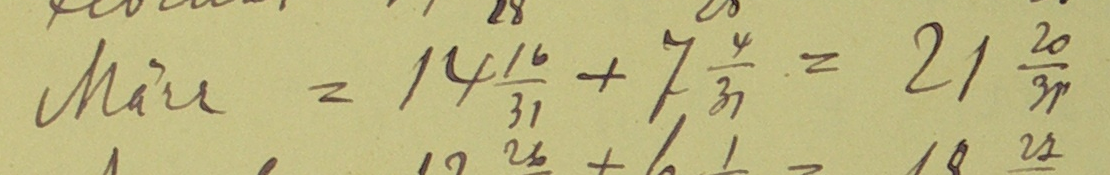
März = 14 16/31 + 7 4/31 = 21 3/28
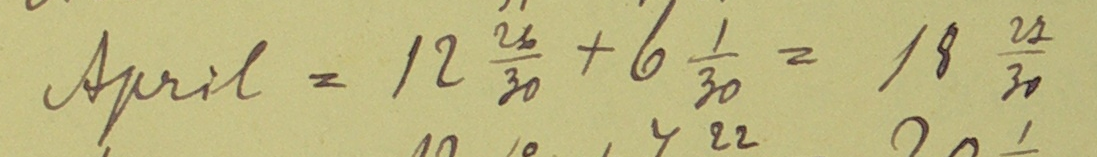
April = 12 26/30 + 6 1/30 = 18 27/30
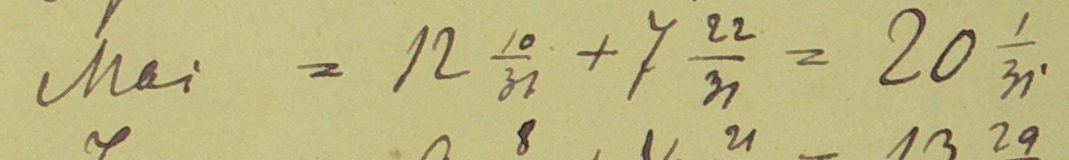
Mai = 12 10/31 + 7 22/31 = 20 1/31
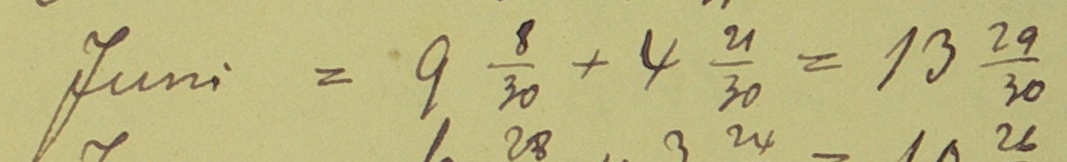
Juni = 9 8/30 + 4 21/31 = 13 29/30
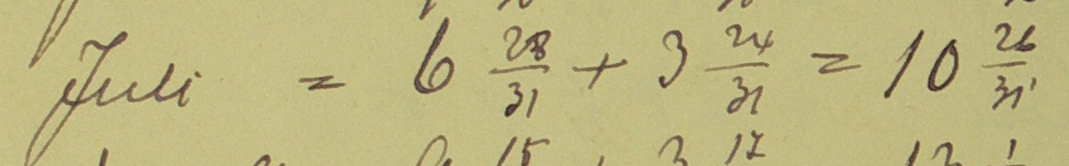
Juli = 6 28/31 + 3 24/31 = 10 26/31
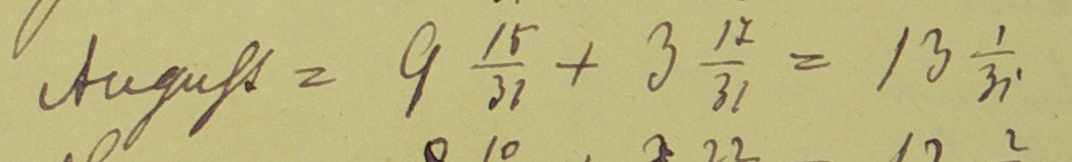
August = 9 15/32 + 3 17/31 = 13 1/31
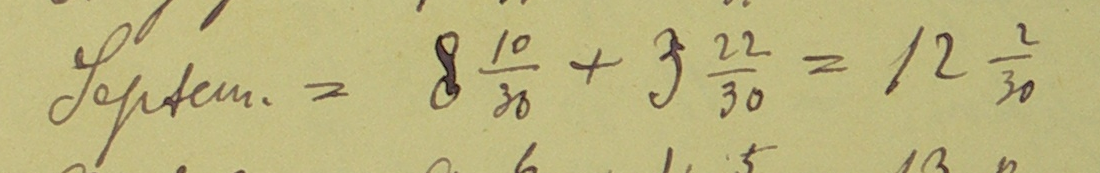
Septem. = 8 10/38 + 3 22/30 = 12 2/30
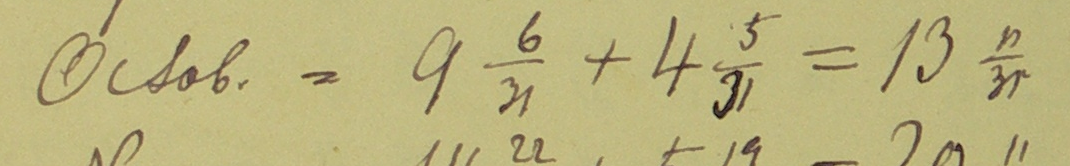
Octob. = 9 6/31 + 4 5/31 = 13 11/31
